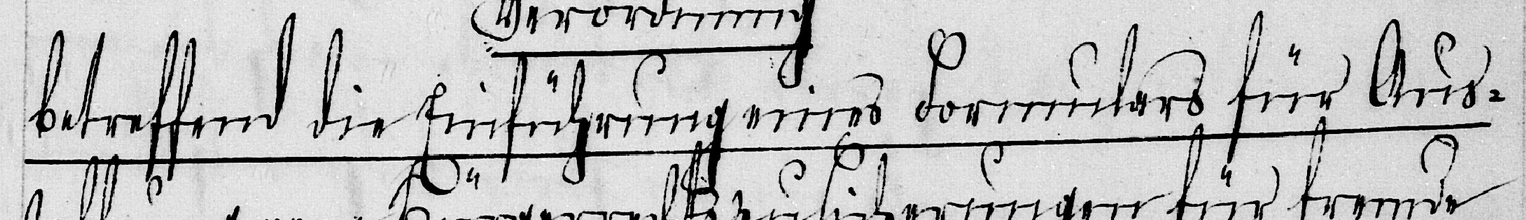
etreffend die Einführung eines Formulars für Aus¬
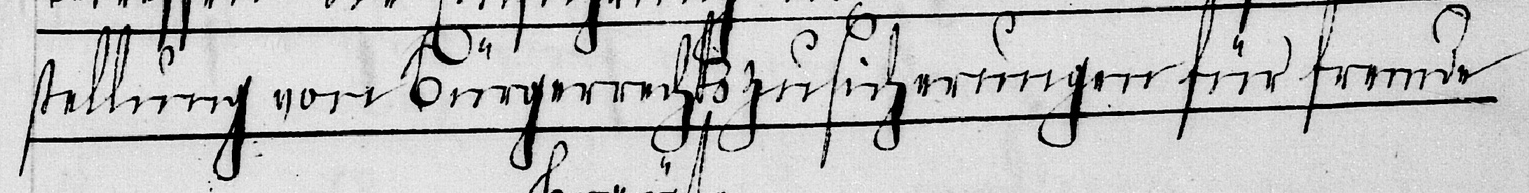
stellung von Bürgerrechtszusicherungen für fremde
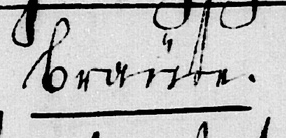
Bräute.
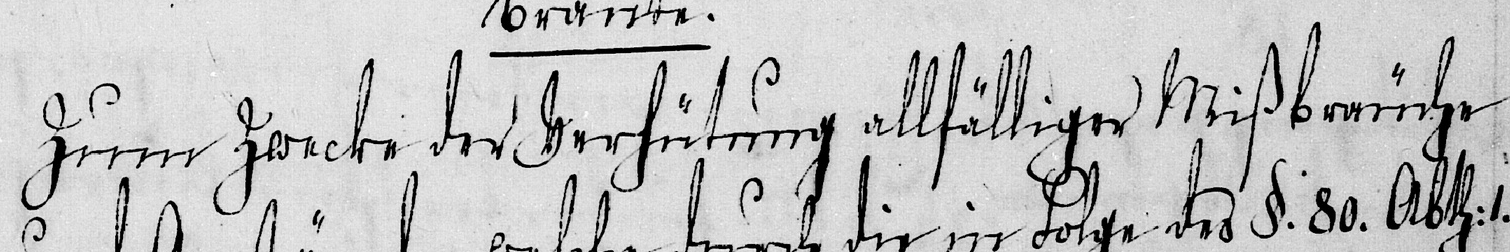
Zum Zwecke der Verhütung allfälliger Mißbräuche
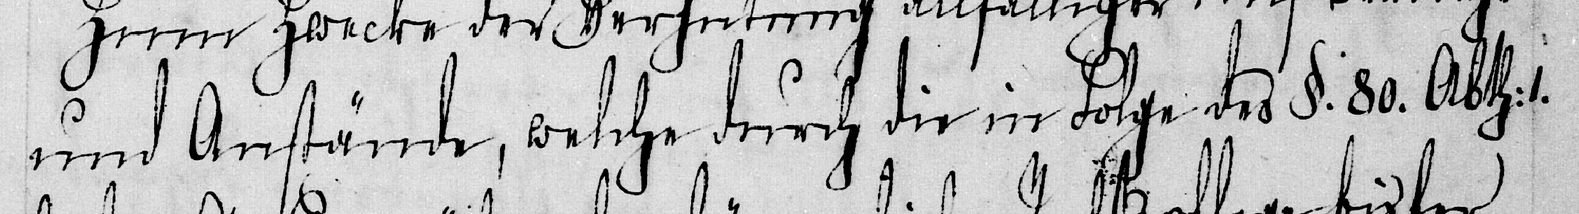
und Anstände, welche durch die in Folge des §. 80. Abth:
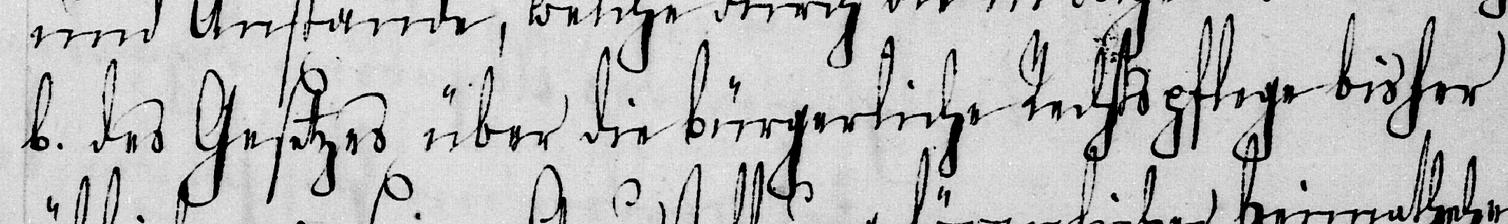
b. des Gesetzes über die bürgerliche Rechtspflege bisher
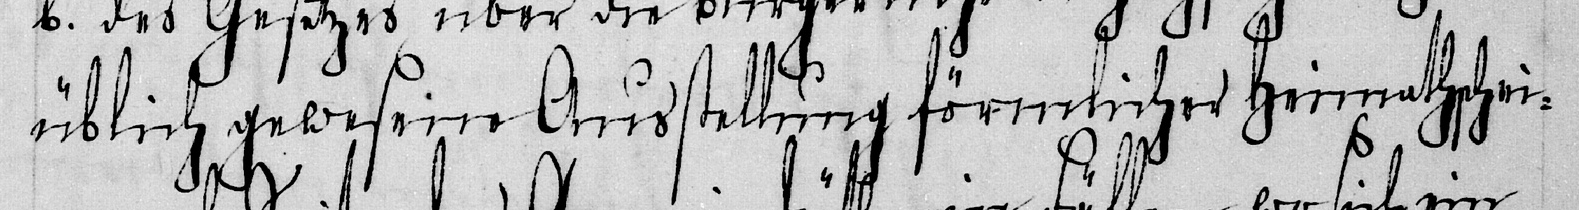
üblich gewesene Ausstellung förmlicher Heimathschei¬
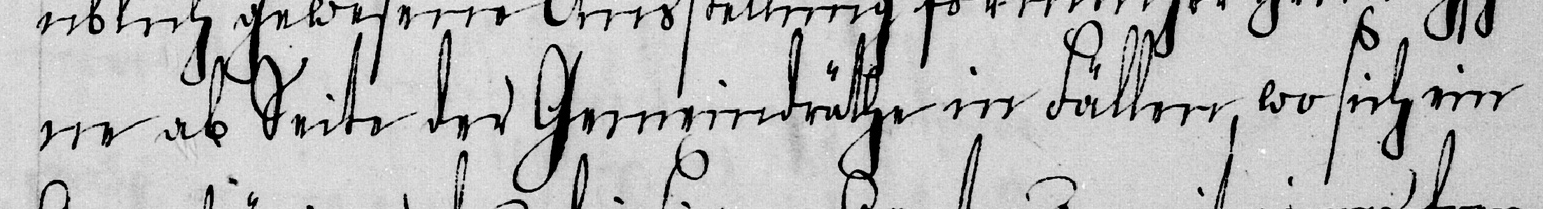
ne ab Seite der Gemeindräthe in Fällen, wo sich ein
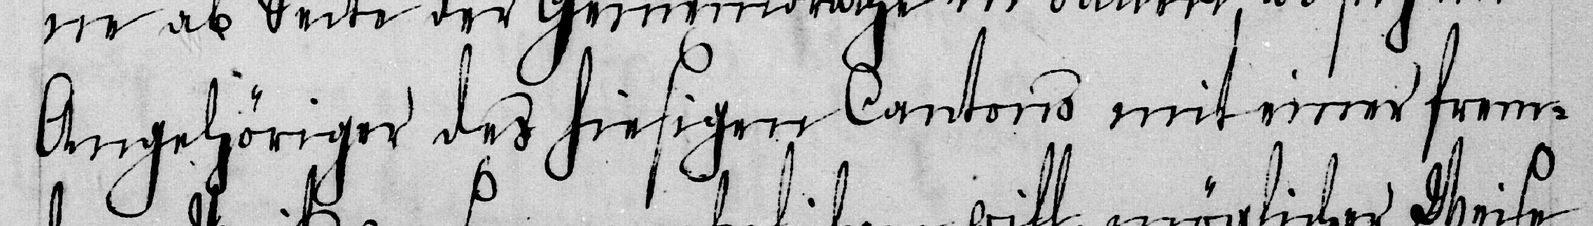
Angehöriger des hiesigen Cantons mit einer frem¬
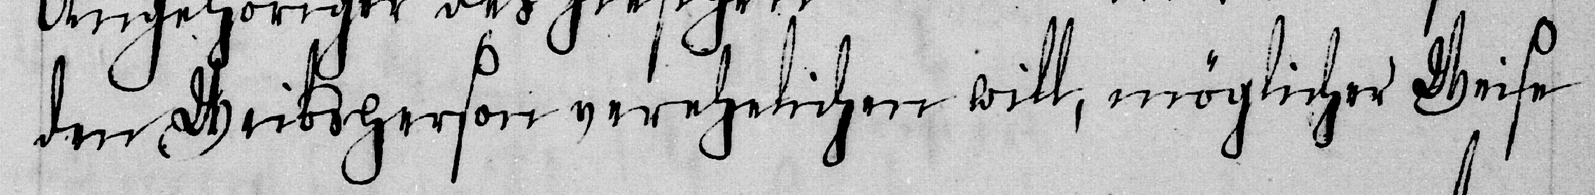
den Weibsperson verehelichen will, möglicher Weise
